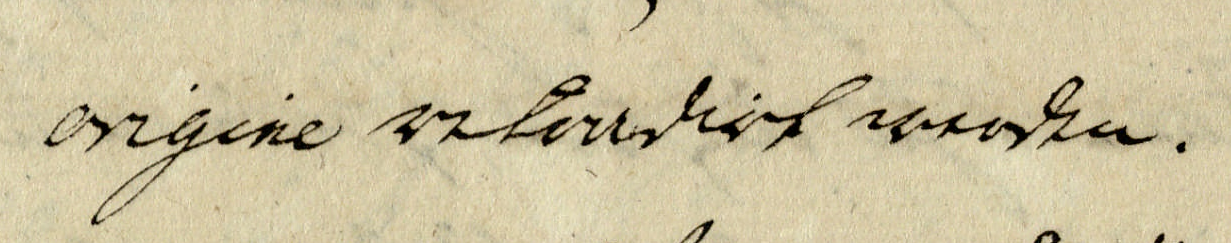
origine retradirt werden.
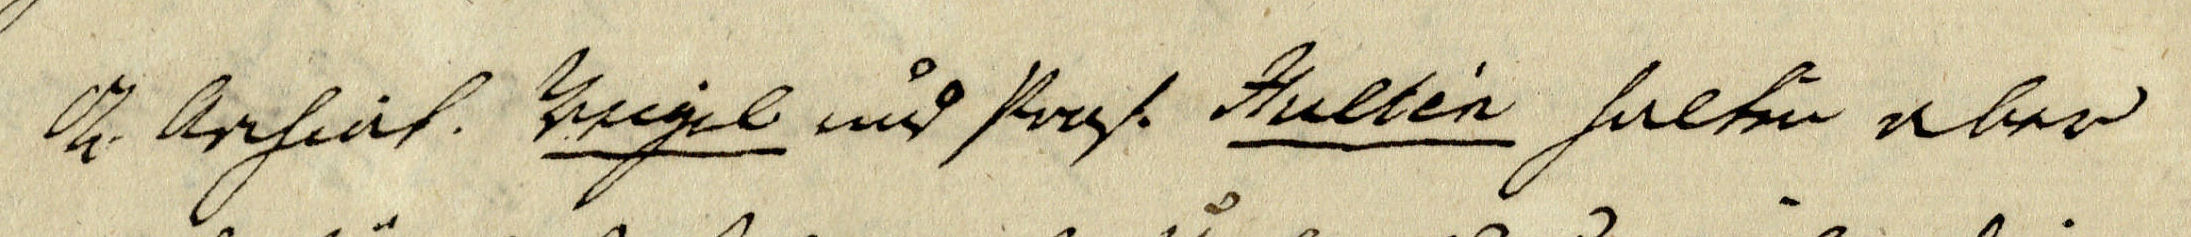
dh. Archiat. Weigel und Prof. Hultén halten aber
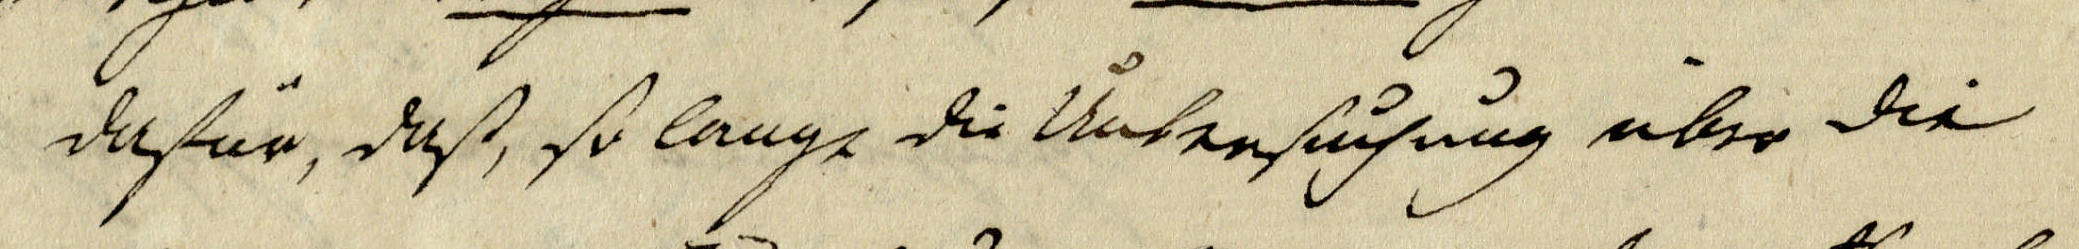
dafür, daß, so lange die Untersuchung über die
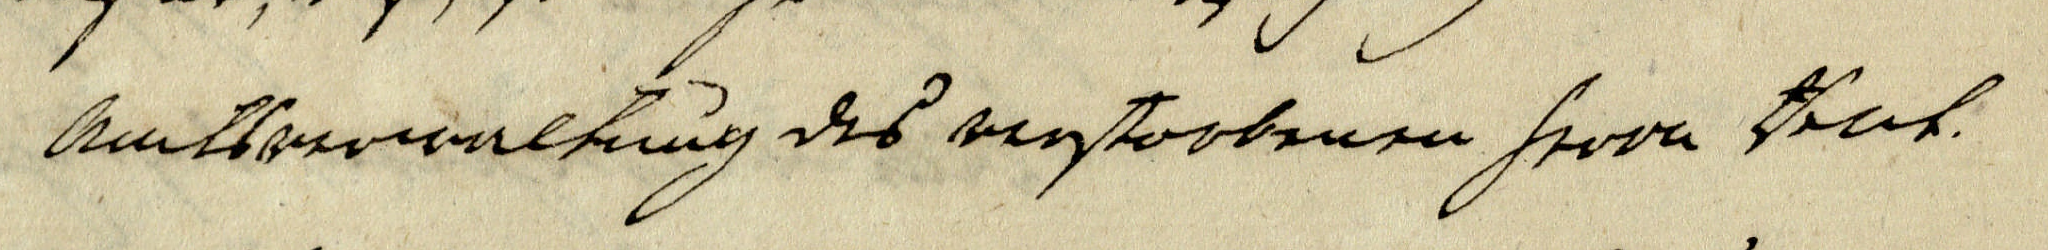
Amtsverwaltung des verstorbenen Herrn Rent¬
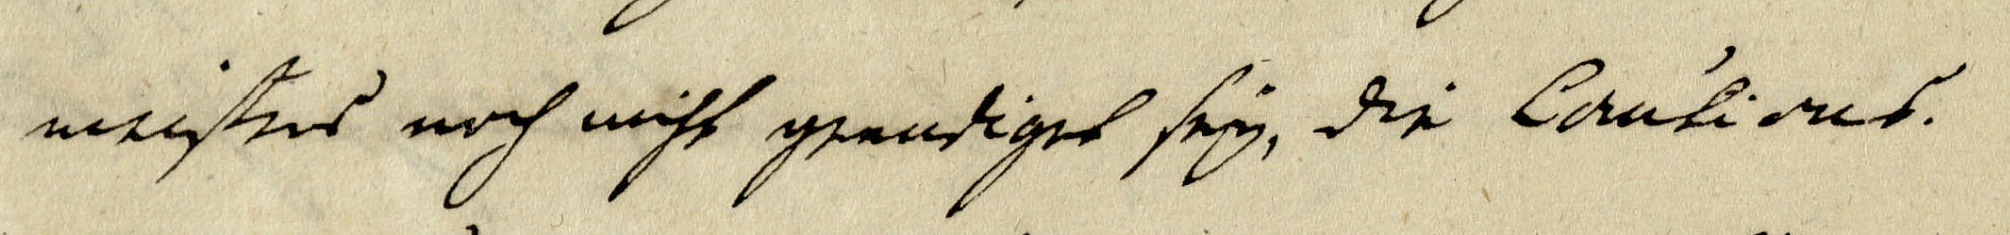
meisters noch nicht geendiget seÿ, die Cautions-
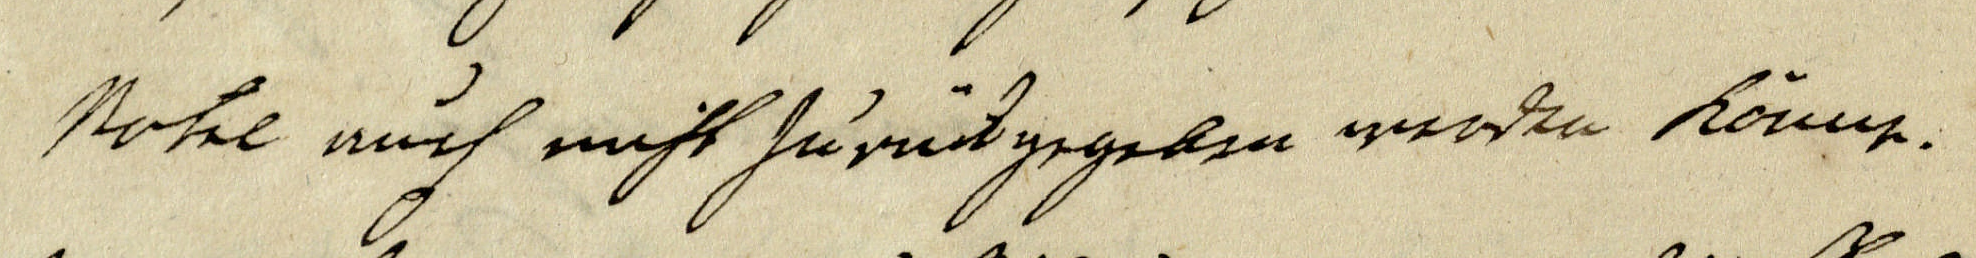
Notel auch nicht zurückgegeben werden könne.
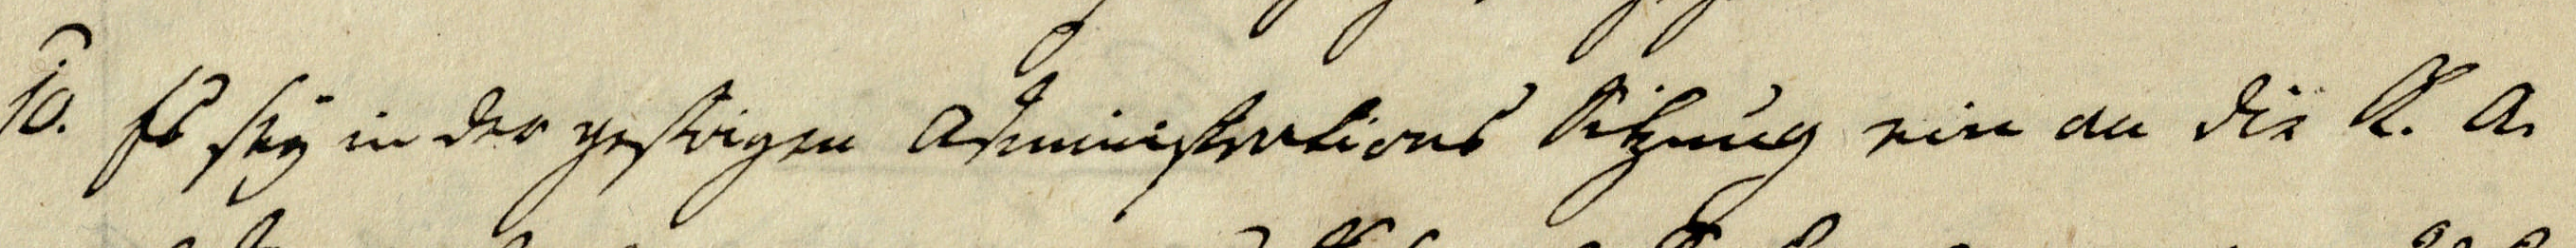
10. Es seÿ in der gestrigen Administrations Sitzung ein an die K. A.
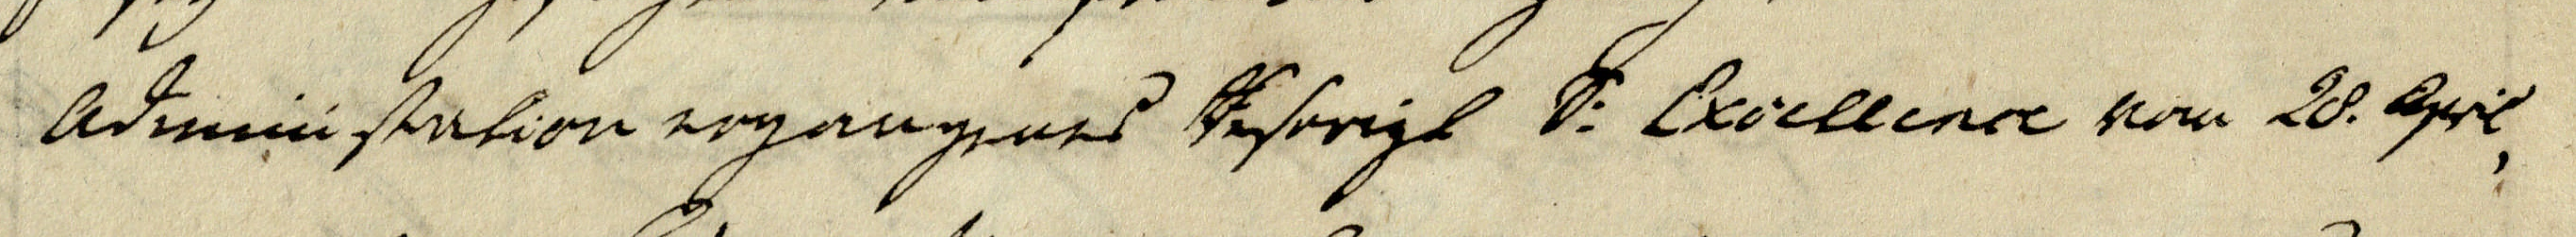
Adminstration ergangenes Rescript Sr. Excellence vom 28. April
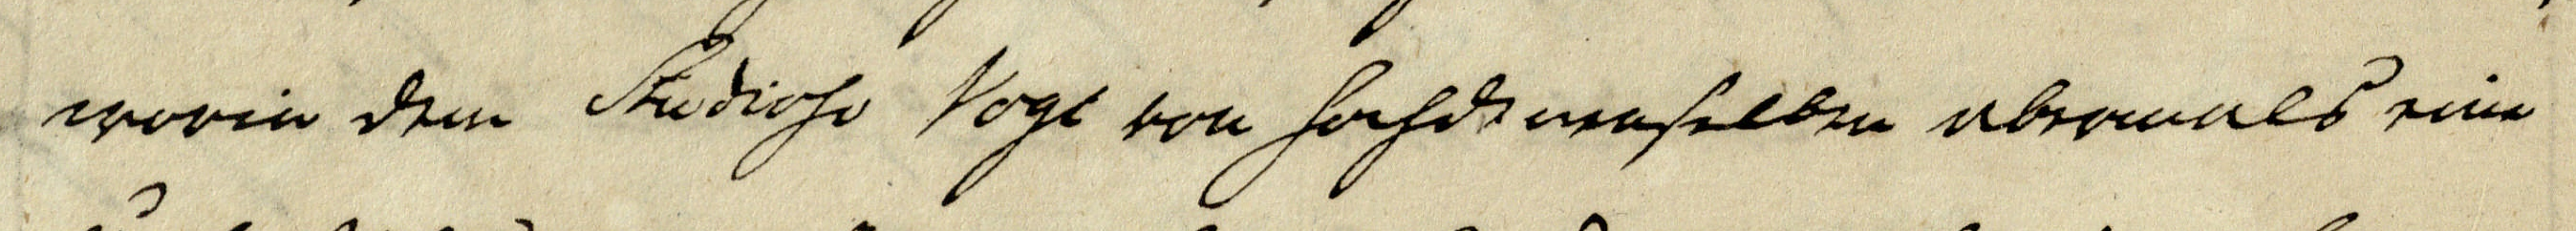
worin dem Studioso Vogt von Hochdenenselben abermals eine
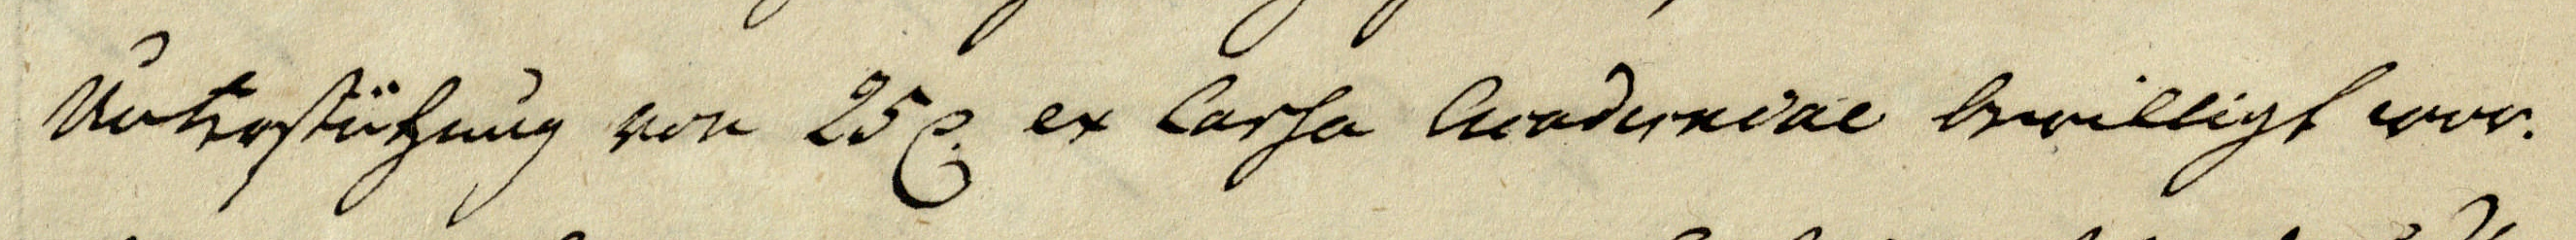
Unterstützung von 25 l. ex Cassa Academiae bewilligt wor¬
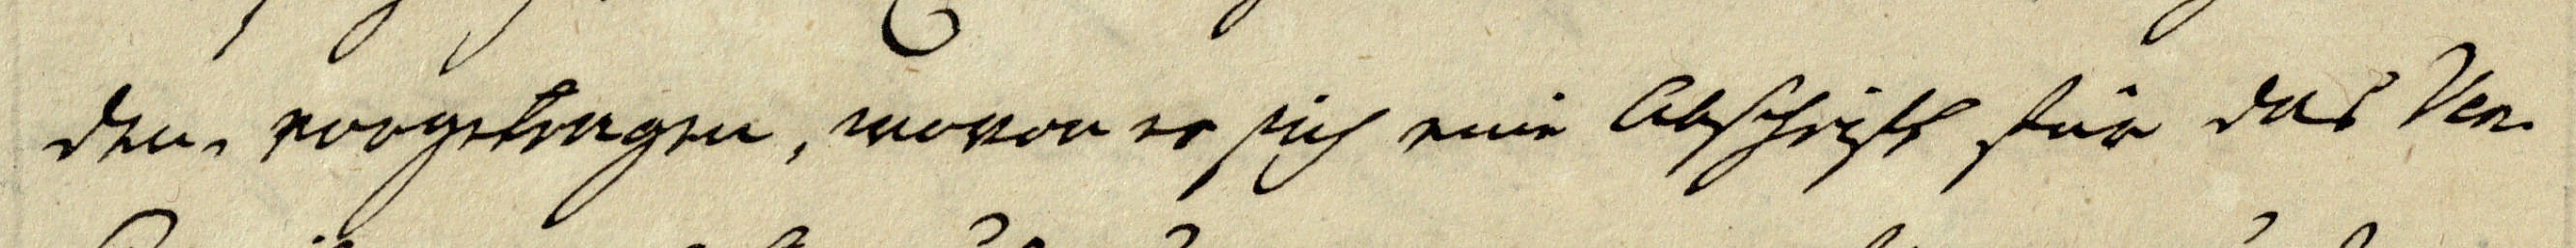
den vorgetragen, wovon er sich eine Abschrift für das Ven.
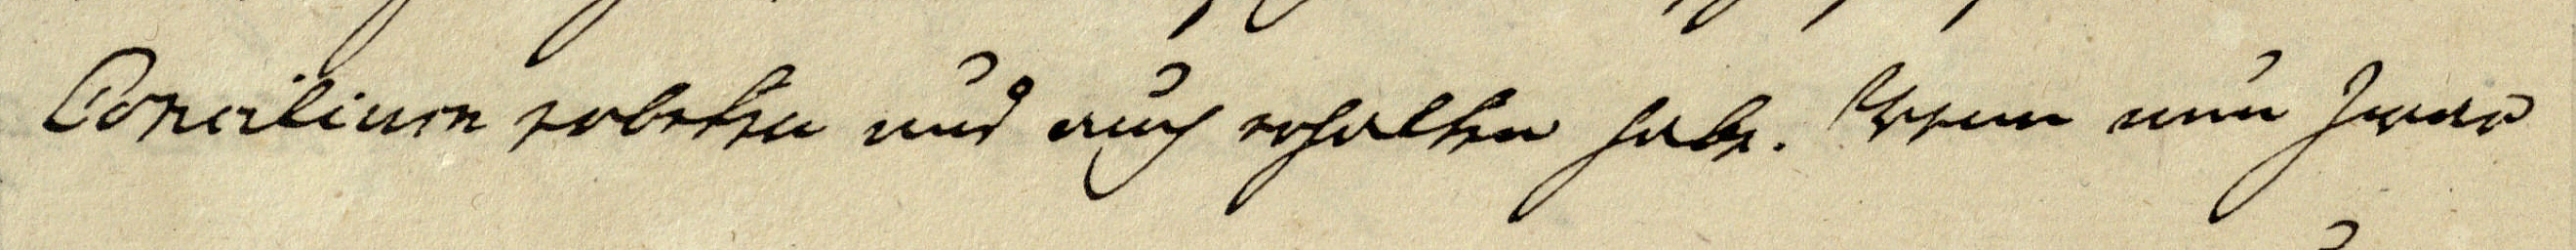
Concilium erbeten und auch erhalten habe. Wenn nun zwar
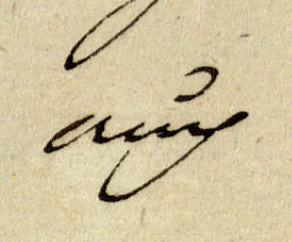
auch
